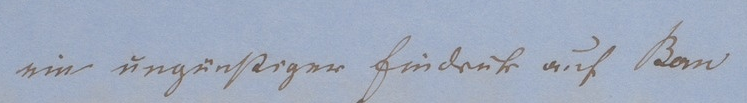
ein ungünstiger Eindruk auf Bern
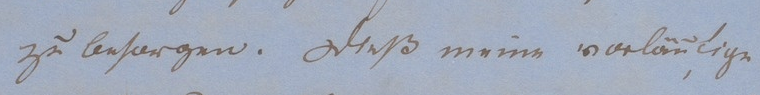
zu besorgen. Dieß meine vorläufige
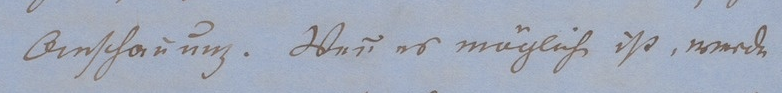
Anschauung. Wenn es möglich ist, werde
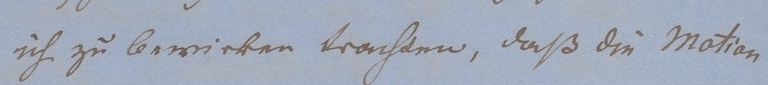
ich zu bewirken trachten, daß die Motion
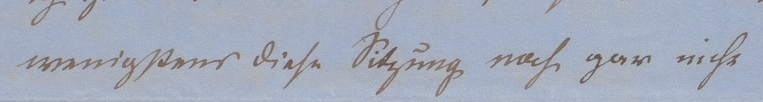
wenigstens diese Sitzung noch gar nicht
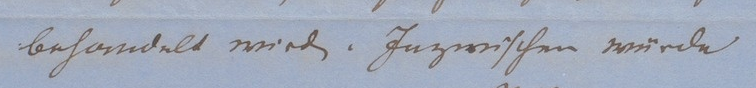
behandelt wird. Inzwischen würde
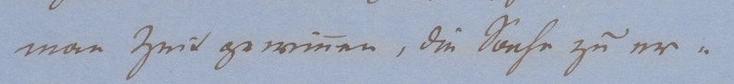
man Zeit gewinnen, die Sache zu er-
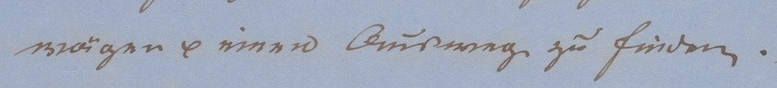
wägen & einen Ausweg zu finden. –
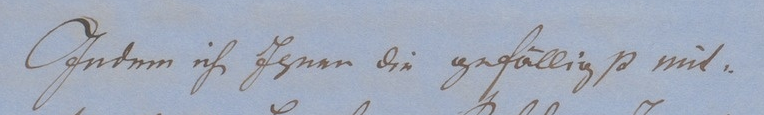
Indem ich Ihnen die gefälligst mit-
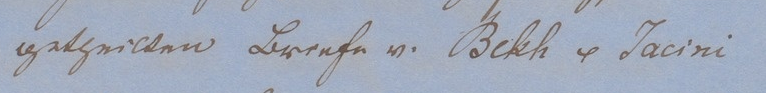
getheilten Briefe v. Bekh & Jacini
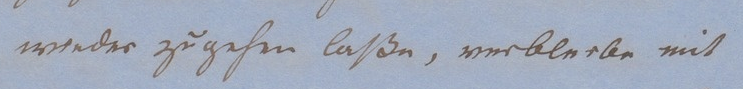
wieder zugehen laße, verbleibe mit
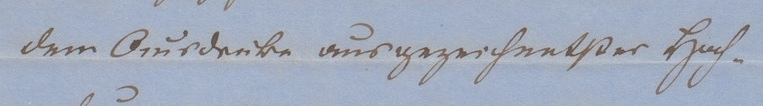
dem Ausdruke ausgezeichnetster Hoch-
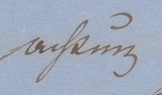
achtung
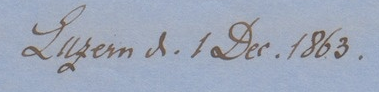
Luzern d. 1 Dec. 1863.
